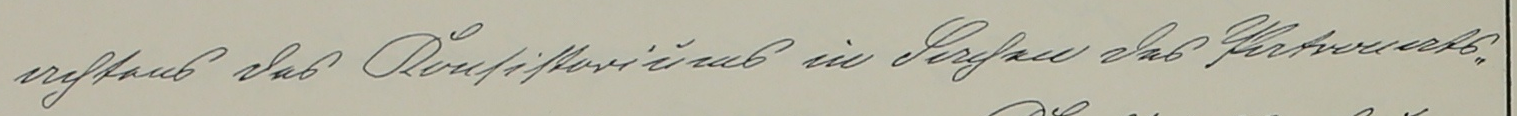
achtens des Konsistoriums in Sachen des Patronats-
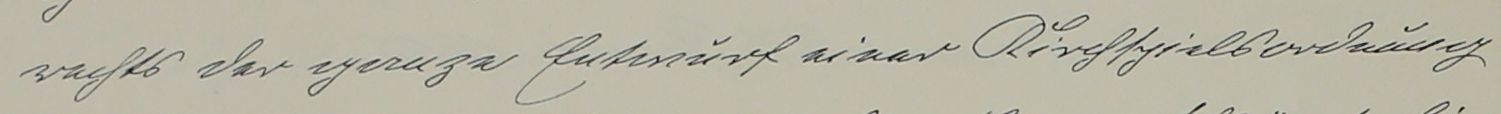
rechts der ganze Entwurf einer Kirchspielsordnung
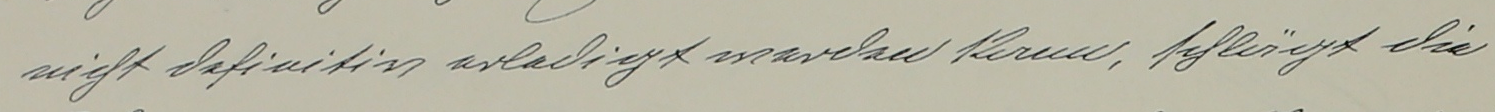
nicht definitiv erledigt werden kann, schlägt die
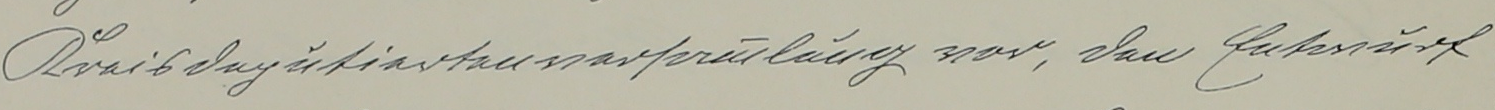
Kreisdeputiertenversammlung vor, den Entwurf
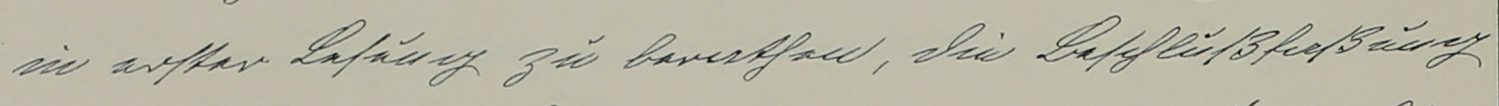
in erster Lesung zu berathen, die Beschlußfaßung
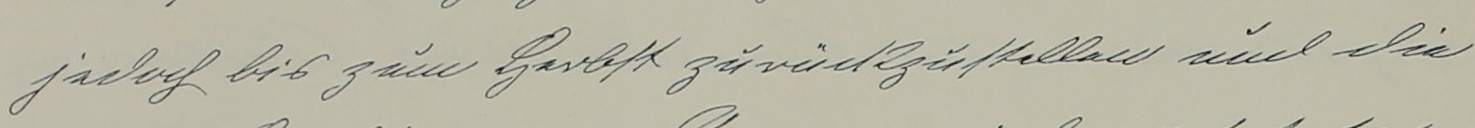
jedoch bis zum Herbst zurückzustellen und die
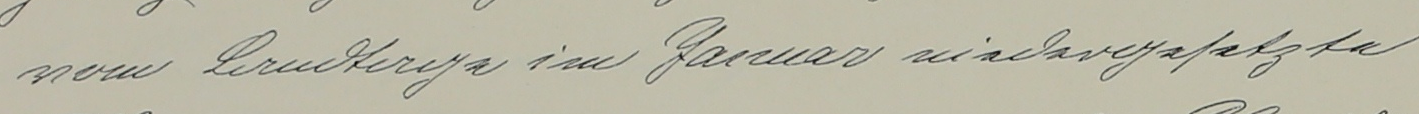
vom Landtage im Januar niedergesetzte
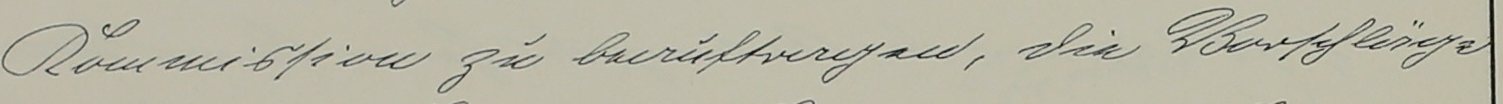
Kommission zu beauftragen, die Vorschläge
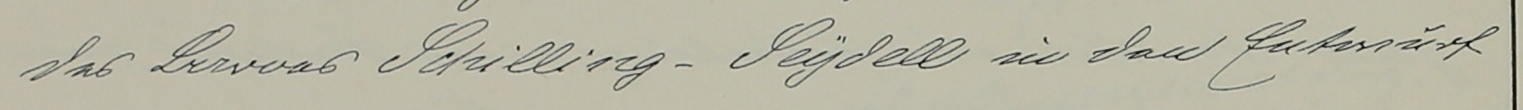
des Barons Schilling-Seydell in den Entwurf
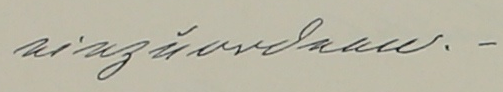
einzuordnen.
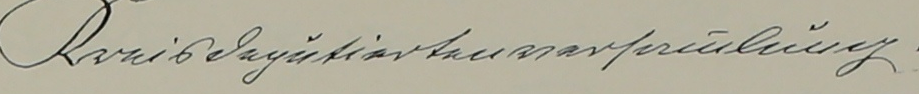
Kreisdeputiertenversammlung.
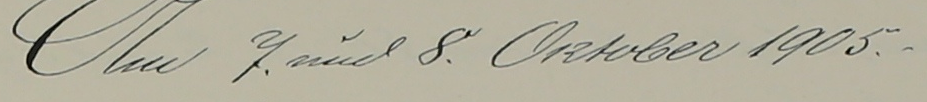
Am 7. und 8. Oktober 1905.
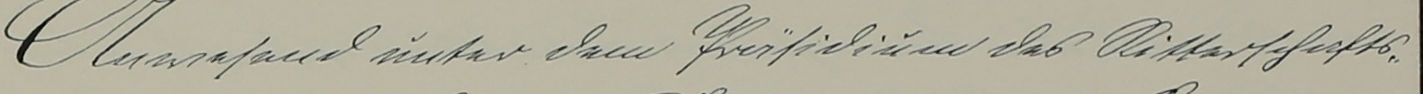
Anwesend unter dem Präsidium des Ritterschafts-
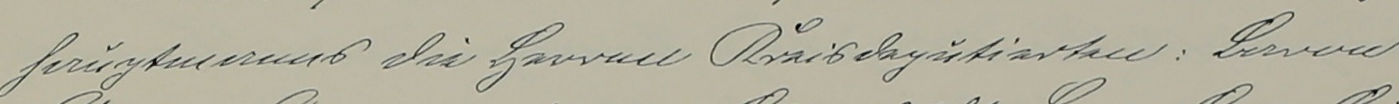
hauptmanns dieHerren Kreisdeputierten: Baron
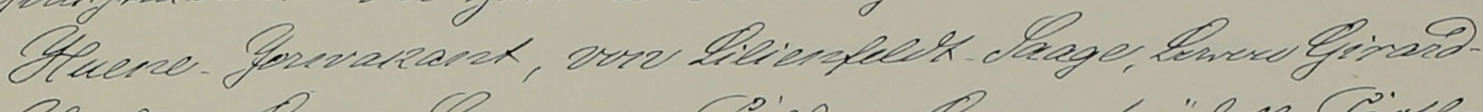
Huene-Jerwakant, von Lilienfeld-Saage, Baron Girard-
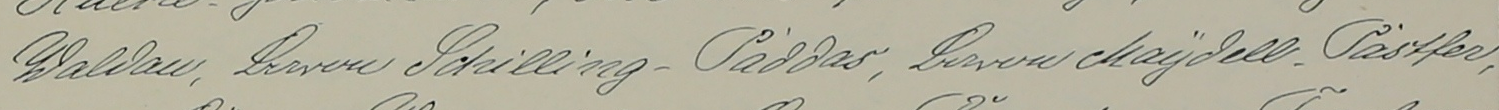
Waldau, Baron Schilling-Paddas, Baron Maydell-Pastfer,
